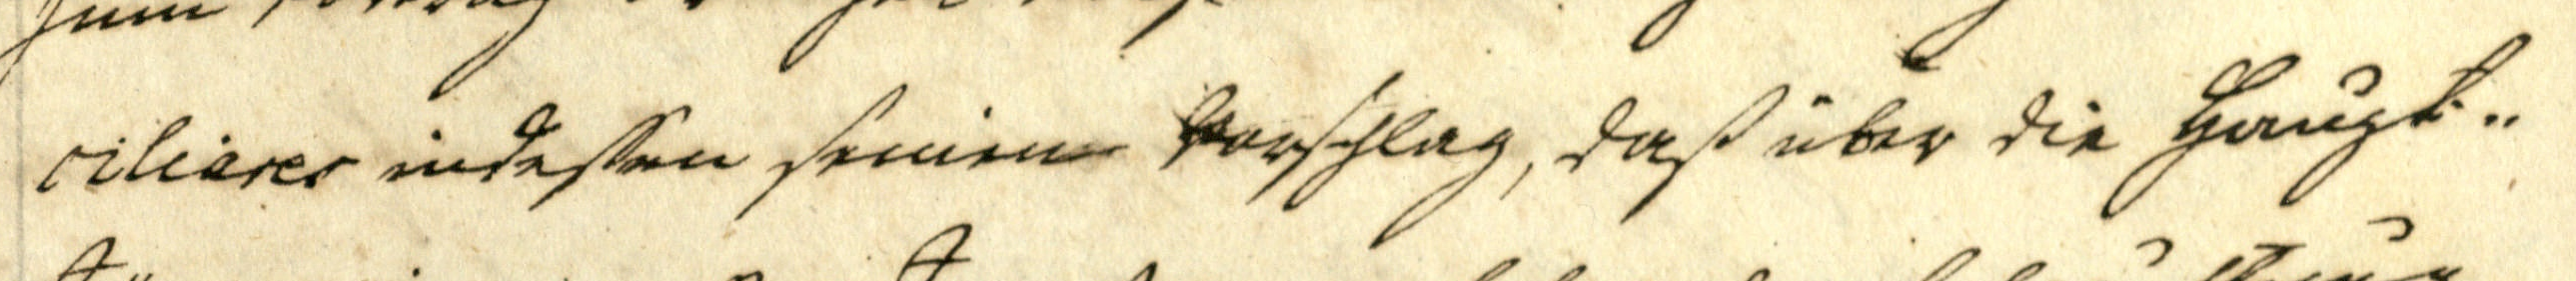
ciliares indessen seinem Vorschlag, daß über die Haupt¬
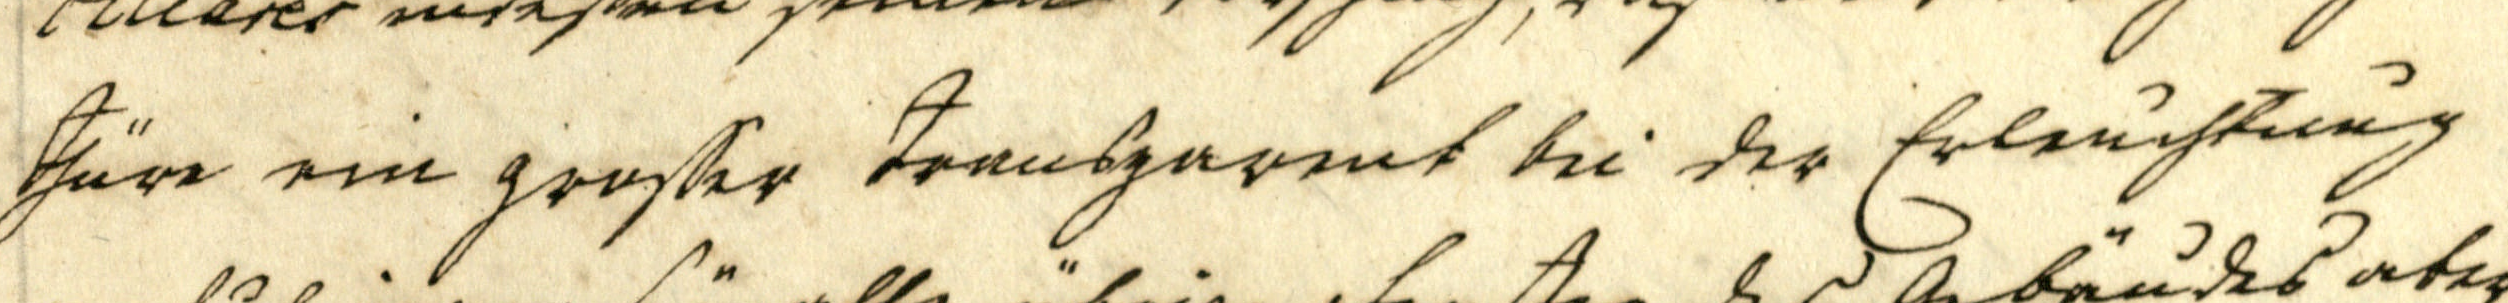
Thüre ein grosser Transparent bei der Erleuchtung
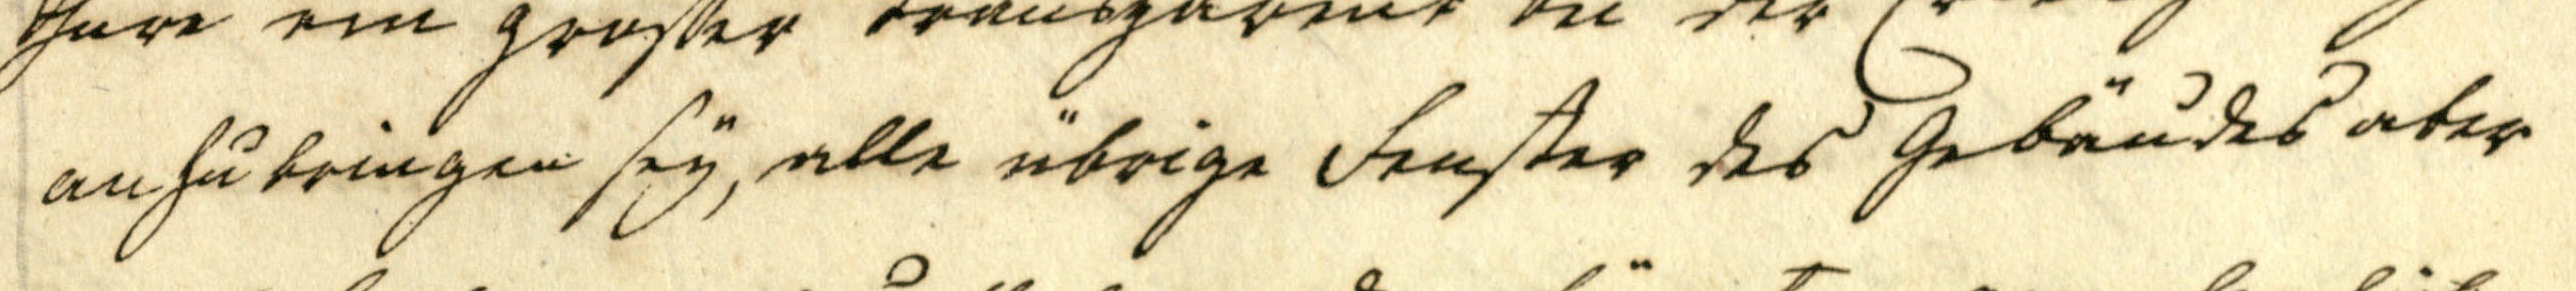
anzubringen seÿ, alle übrige Fenster des Gebäudes aber
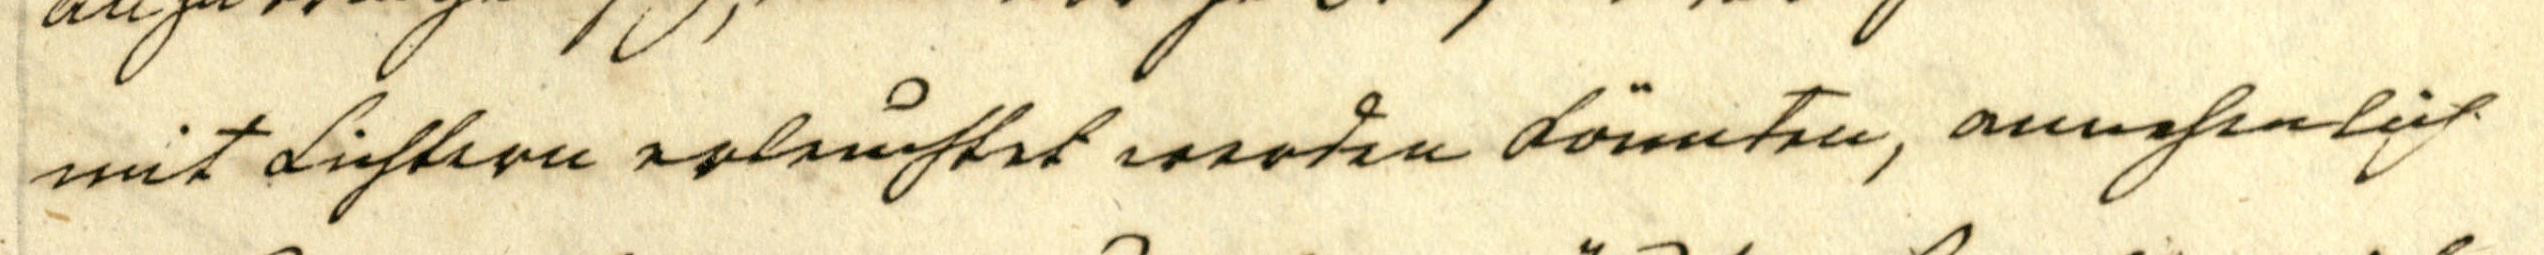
mit Lichtern erleuchtet werden könnten, annehmlich
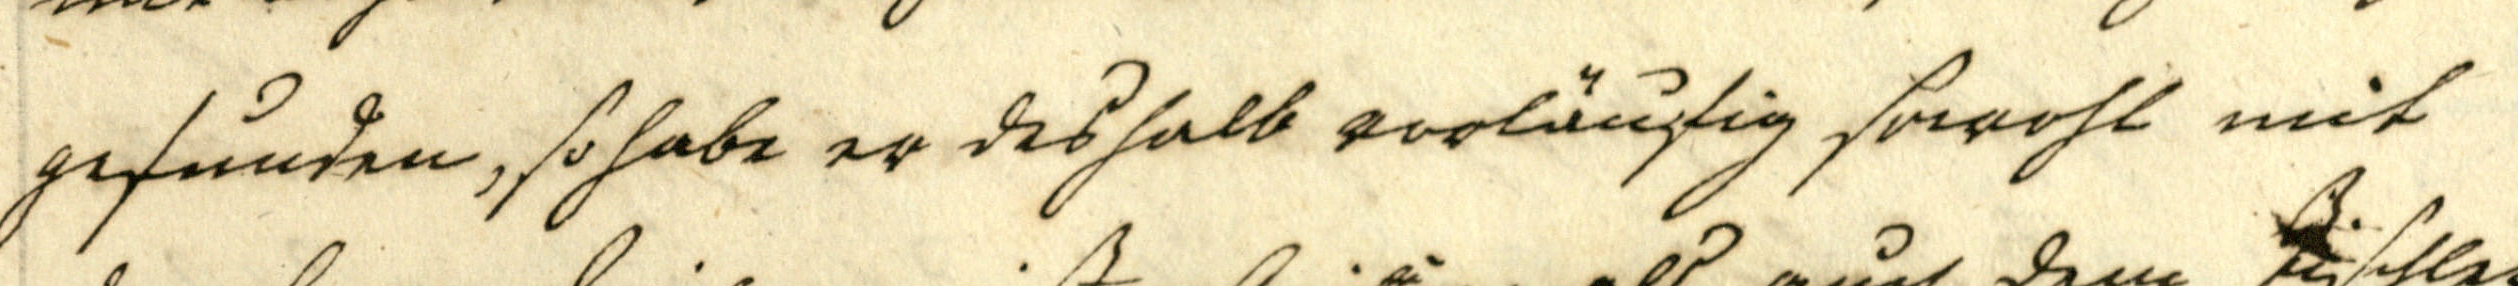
gefunden, so habe er deshalb vorläufig sowohl mit
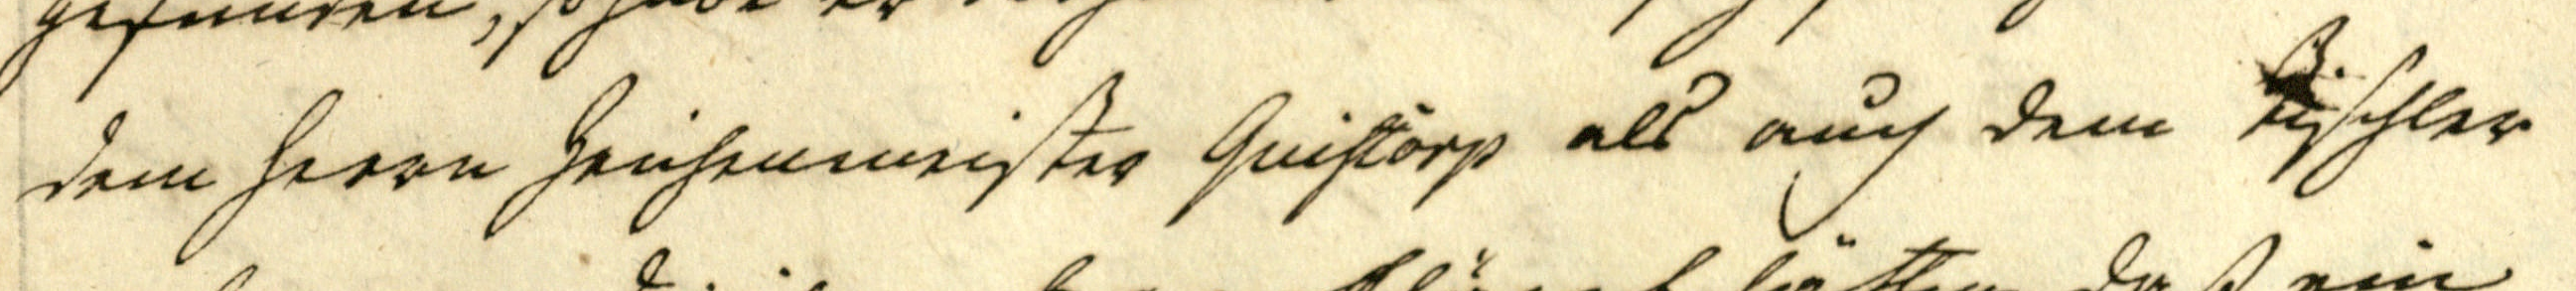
dem Herrn Zeichenmeister Quistorp als auch dem Tischler
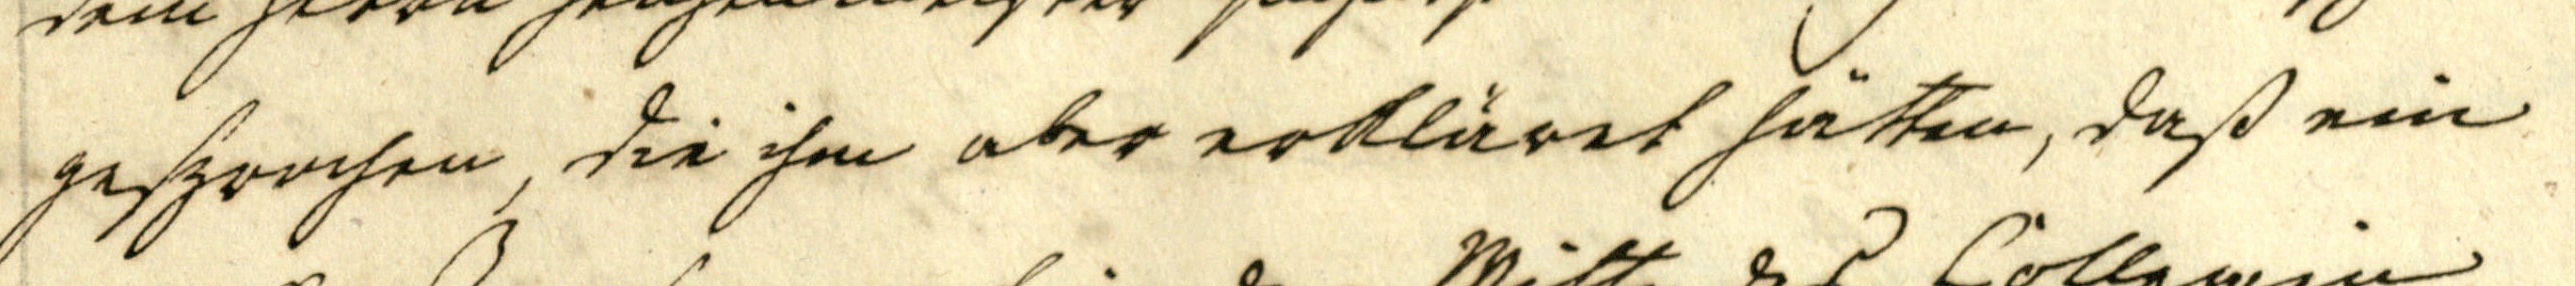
gesprochen, die ihm aber erkläret hätten, daß ein
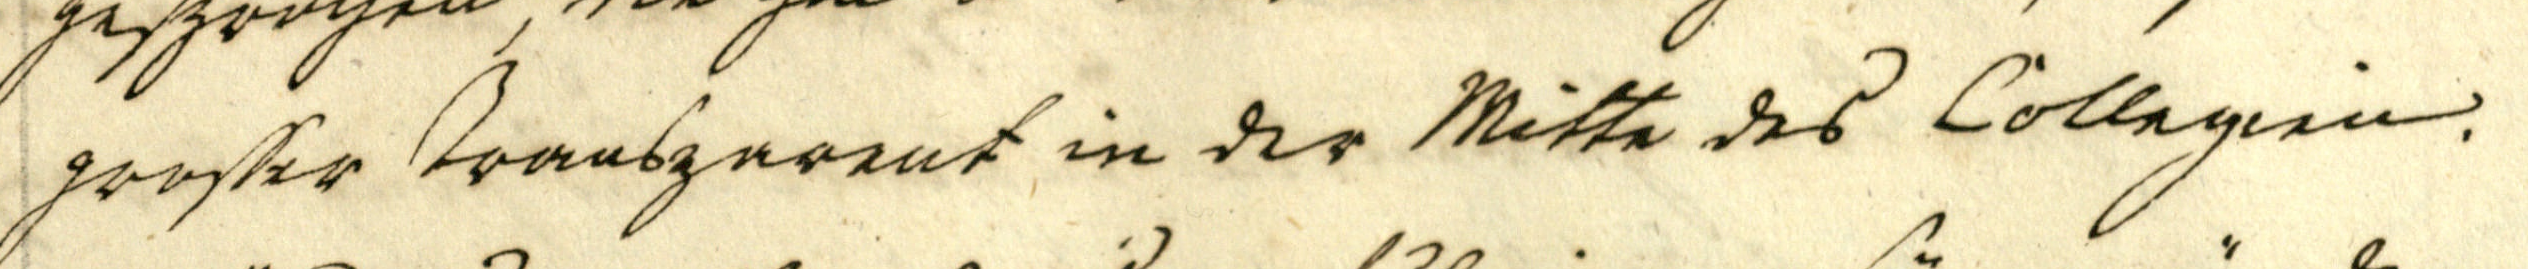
grosser Transparent in der Mitte des Collegien¬
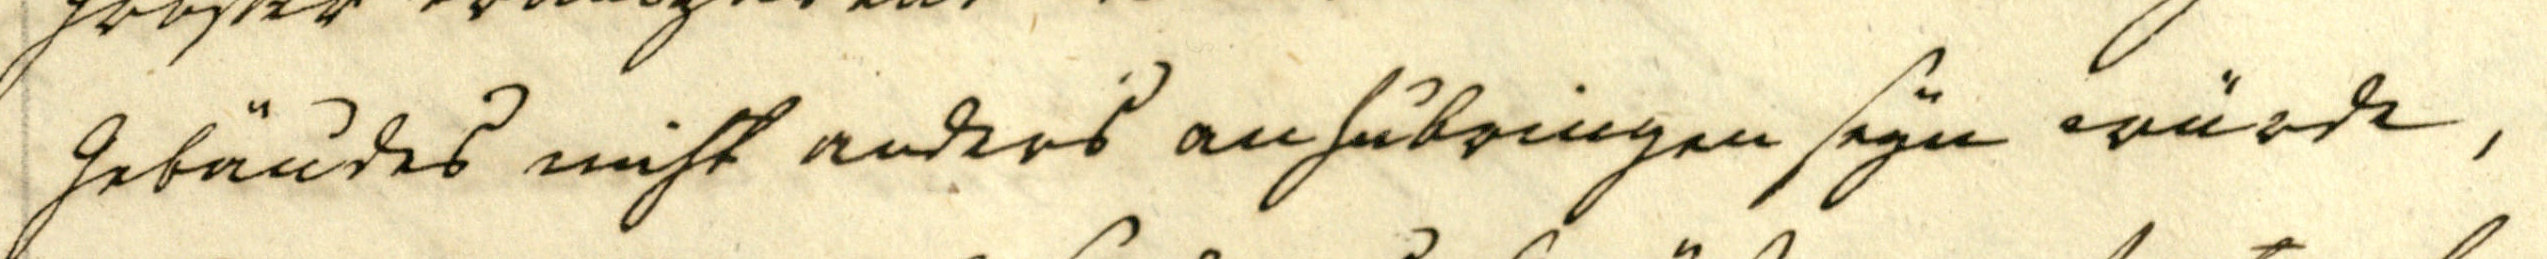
Gebäudes nicht anders anzubringen seÿn würde,
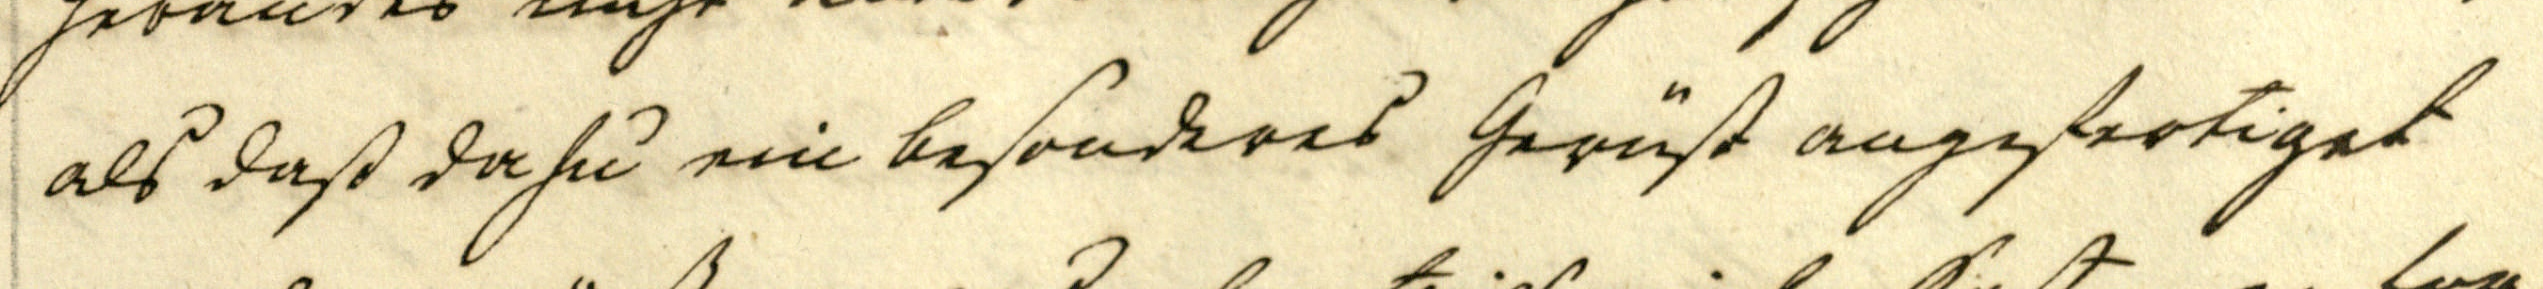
als daß dazu ein besonderes Gerüst angefertiget
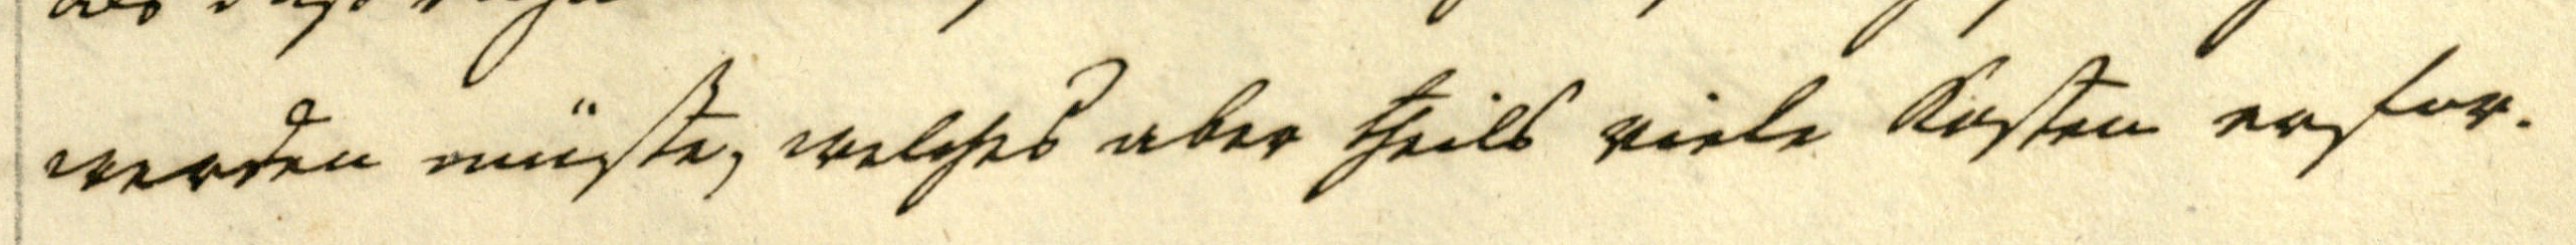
werden müßte, welches aber theils viele Kosten erfor¬
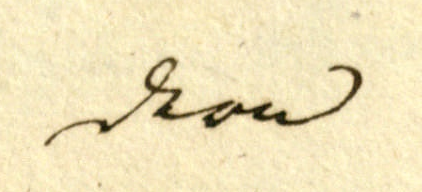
dern
